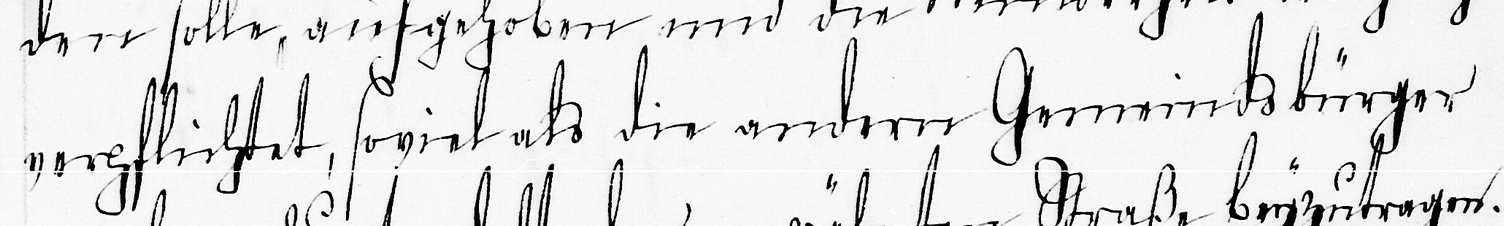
verpflichtet, soviel als die andern Gemeindsbürger
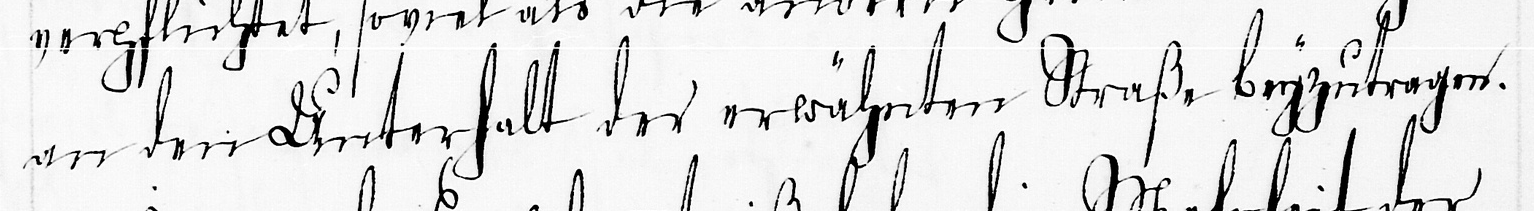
an den Unterhalt der erwähnten Straße beyzutragen.
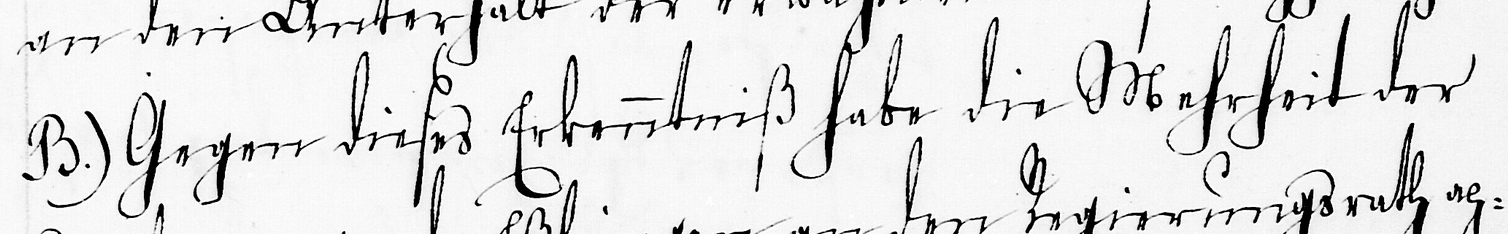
B.) Gegen dieses Erkenntniß habe die Mehrheit der
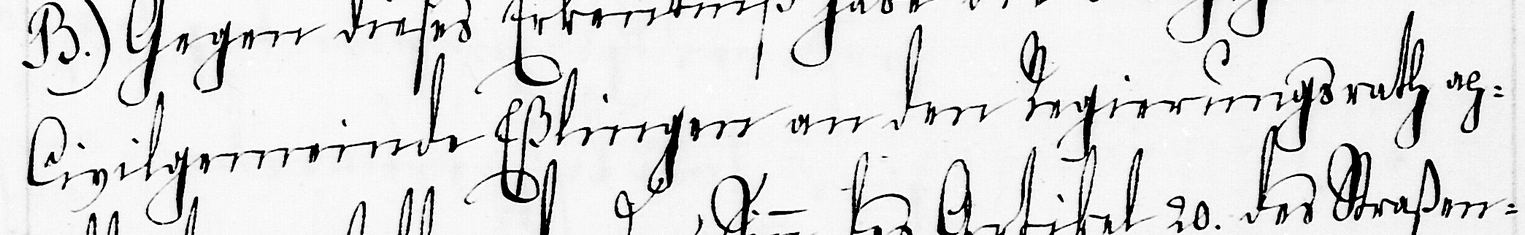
Civilgemeinde Eßlingen an den Regierungsrath ap¬
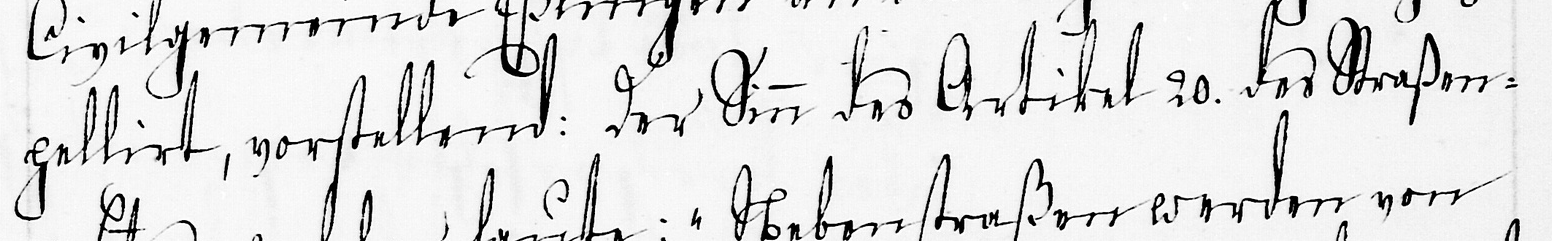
pellirt, vorstellend: Der Sinn des Artikel 20. des Straßen¬
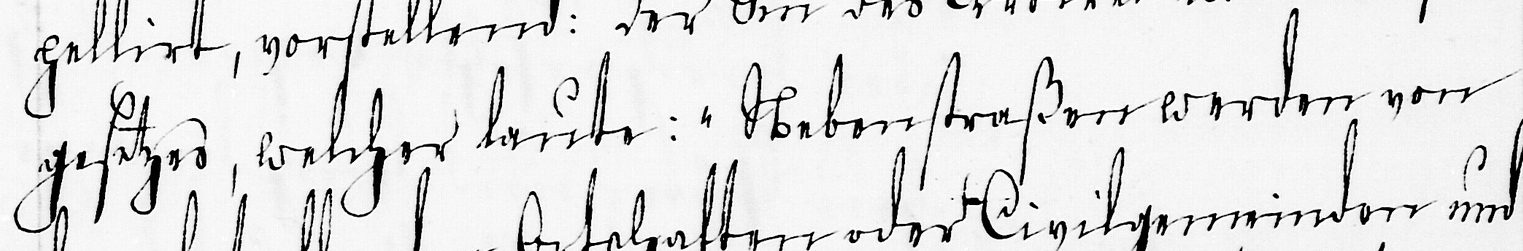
gesetzes, welcher laute: „Nebenstraßen werden von
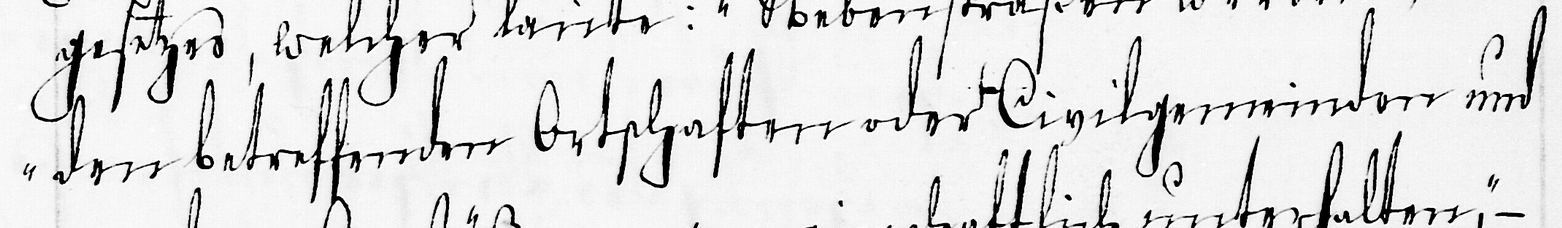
den betreffenden Ortschaften oder Civilgemeinden und
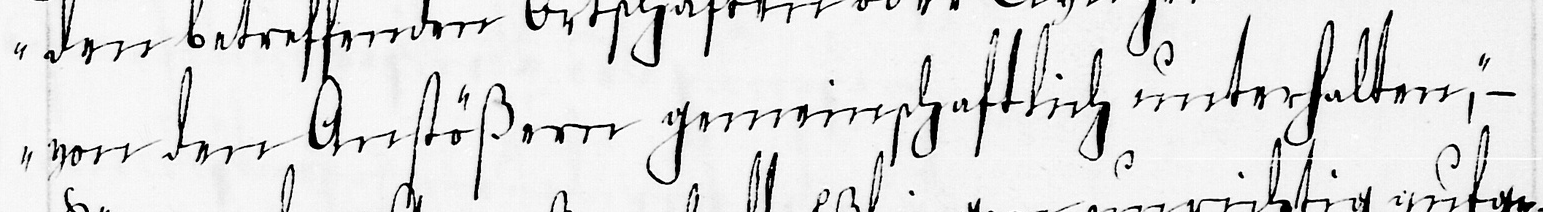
von den Anstößern gemeinschaftlich unterhalten“, –
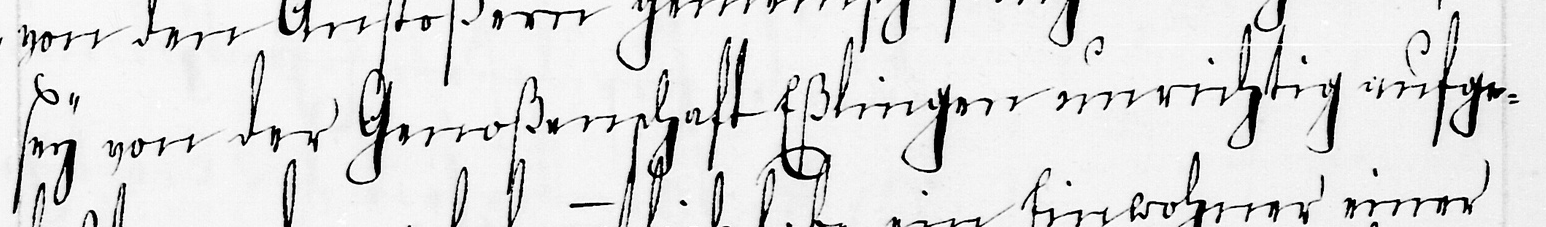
sey von der Genoßenschaft Eßlingen unrichtig aufge¬
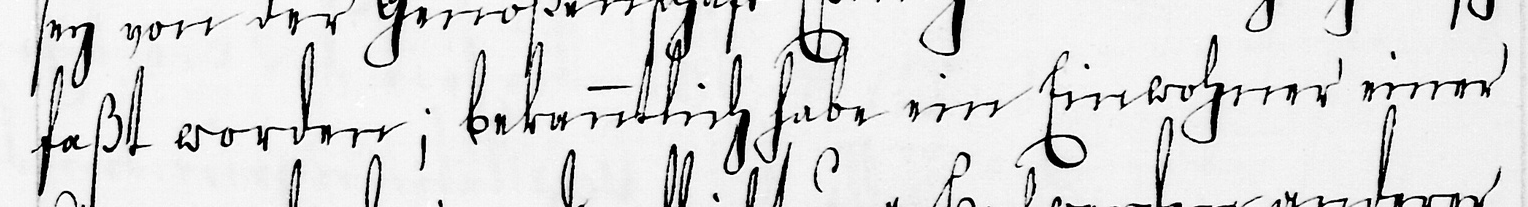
faßt worden; bekanntlich habe ein Einwohner einer
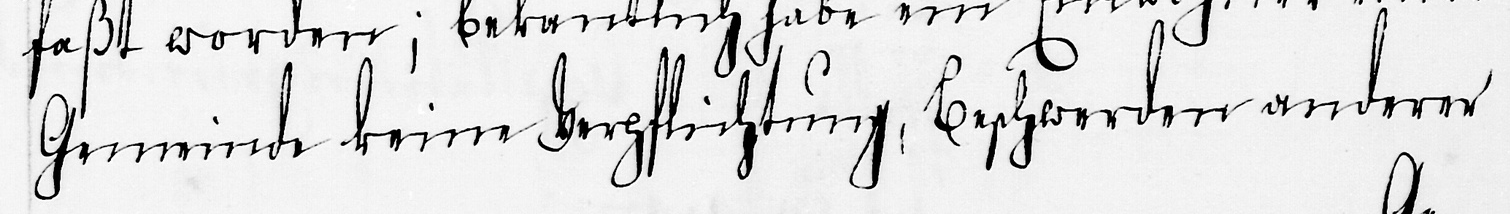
Gemeinde keine Verpflichtung, Beschwerden anderer
